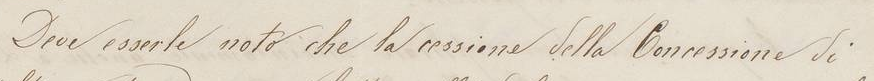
Deve esserle noto che la cessione della Concessione di
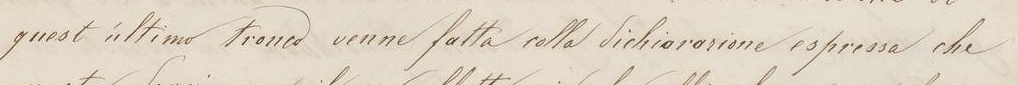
quest'ultimo tronco venne fatta colla dichiarazione espressa che
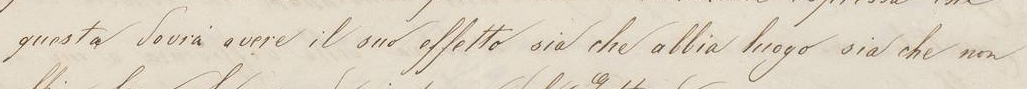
questa dovrà avere il suo effetto sia che allia luogo sia che non
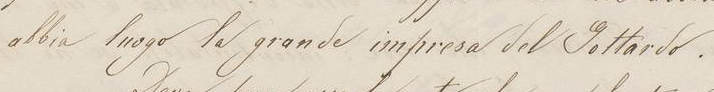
abbia luogo la grande impresa del Gottardo.
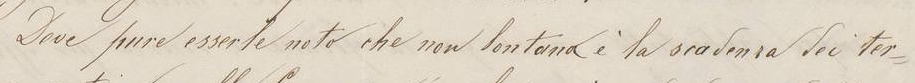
Deve pure esserle noto che non lontana è la scadenza dei ter-
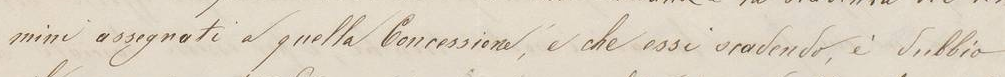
mini assegnati a quella Concessione, e che essi scadendo, è dubbio
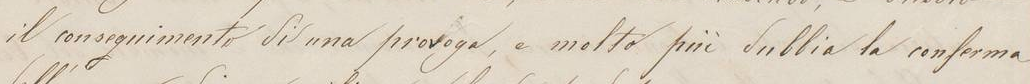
il conseguimento di una provoga, e molto più dubbia la conferma
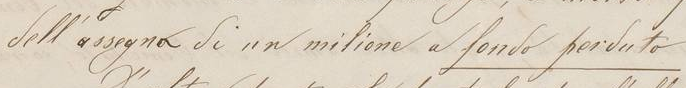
dell'assegna di un milione a fondo perduto.
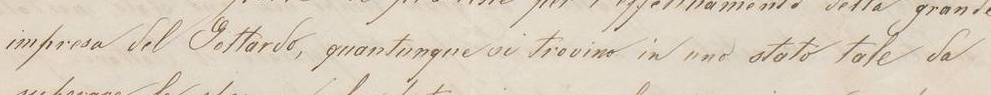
impresa del Gottardo, quatunque si trovino in uno stato tale da
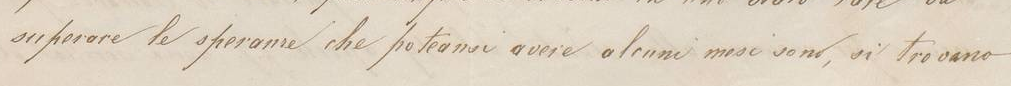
superare le speranze che poteanoi avere alcuni mesi sono, si trovano
